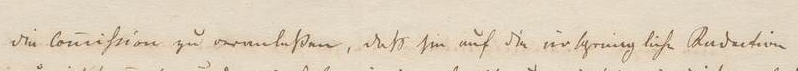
die Commißion zu veranlaßen, daß sie auf die ursprüngliche Redaction
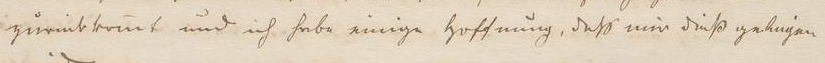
zurückkommt und ich habe einige Hoffnung, daß mir dieß gelingen
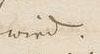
wird.
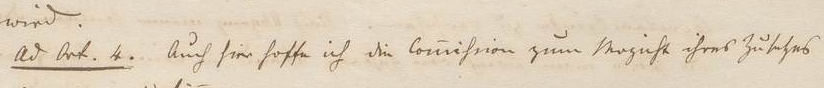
Ad Art. 4. Auch hier hoffe ich die Commißion zum Verzicht ihres Zusatzes
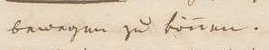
bewegen zu können.
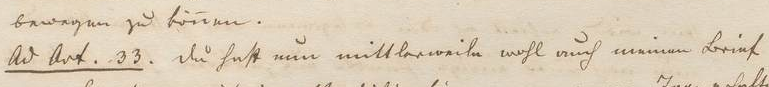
Ad Art. 33. Du hast nun mittlerweile wohl auch meinen Brief
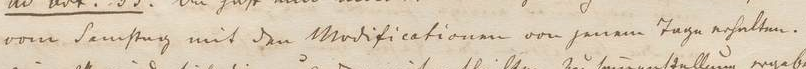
vom Samstag mit den Modificationen von jenem Tage erhalten.
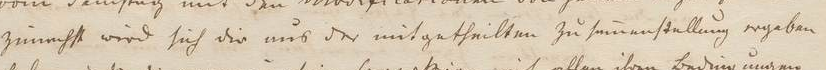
Zunächst wird sich Dir aus der mitgetheilten Zusammenstellung ergeben
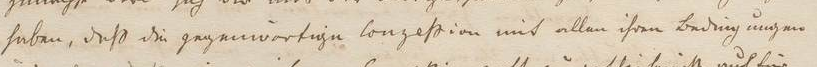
haben, daß die gegenwärtige Conzession mit allen ihren Bedingungen
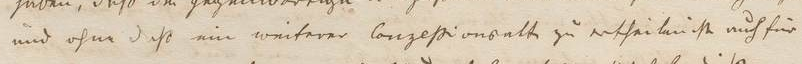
und ohne daß ein weiterer Conzessionsakt zu ertheilen ist auch für
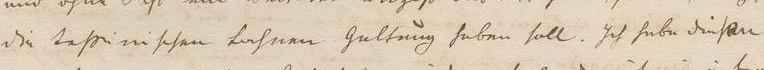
die tessinischen Bahnen Geltung haben soll. Ich habe diese
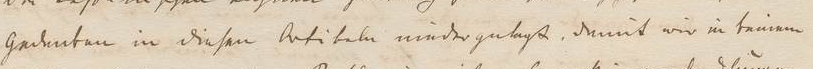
Gedanken in diesen Artikeln niedergelegt, damit wir in keinem
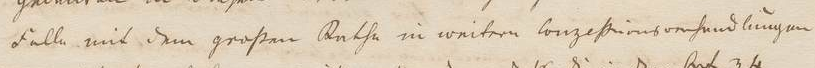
Falle mit dem großen Rathe in weitere Conzessionsverhandlungen
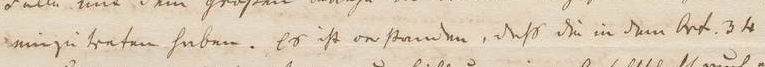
einzutreten haben. Es ist verstanden, daß die in dem Art. 34
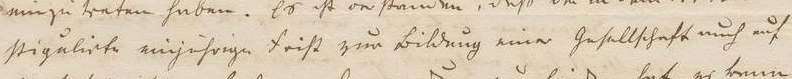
stipulirte einjährige Frist zur Bildung eine Gesellschaft auch auf
